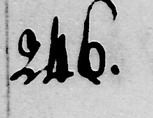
4144.
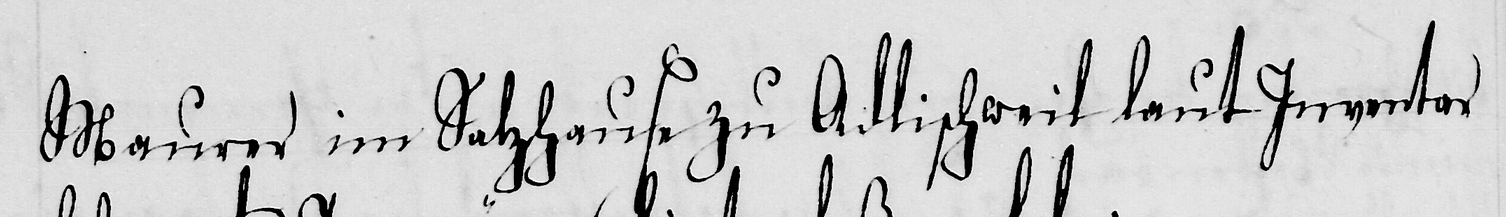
Maurer im Salzhause zu Adlischweil laut Inventar
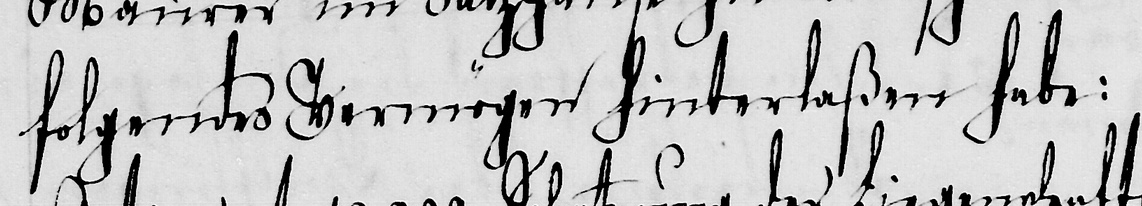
folgendes Vermögen hinterlaßen habe:
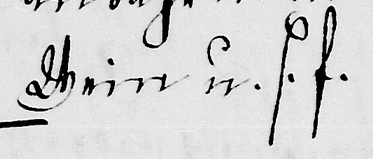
Wein u.s. f.
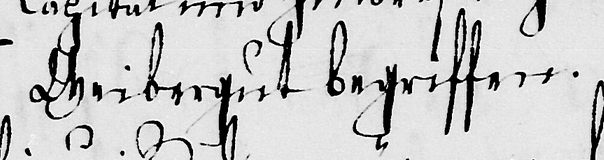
Weibergut begriffen.
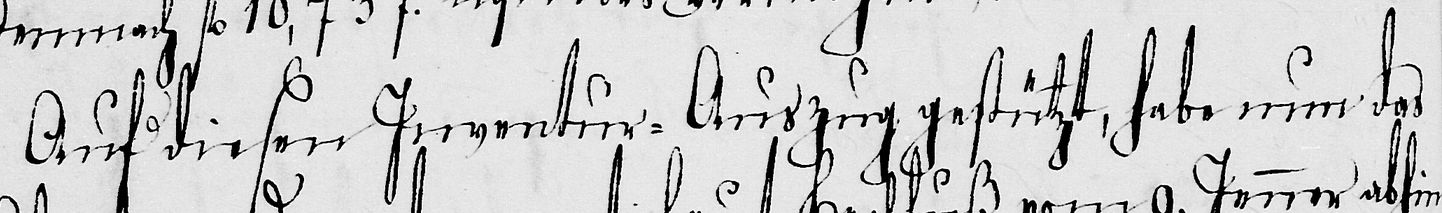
Auf diesen Inventur-Auszug gestützt, habe nun das
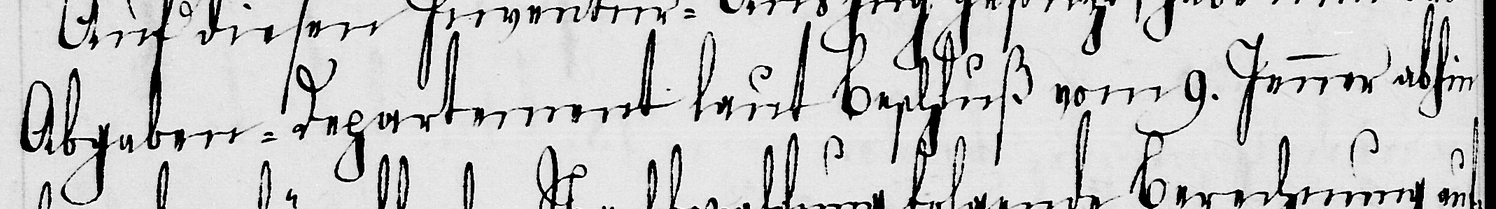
Abgaben-Departement laut Beschluß vom 9. Jenner abhin
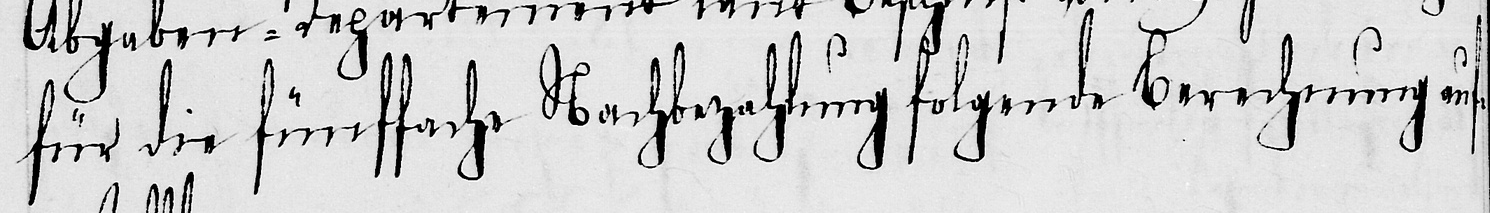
für die fünffache Nachbezahlung folgende Berechnung a¬
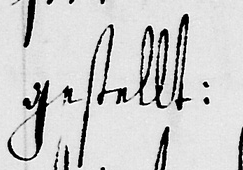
gestellt:
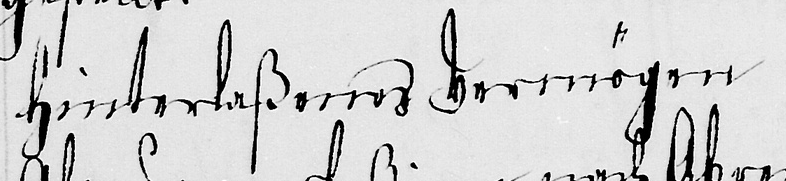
Hinterlaßenes Vermögen
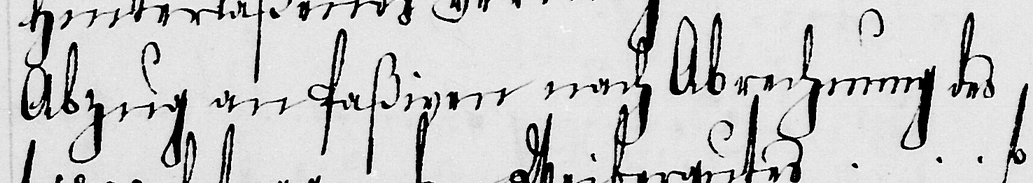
Abzug an Paßiven nach Abrechnung des
